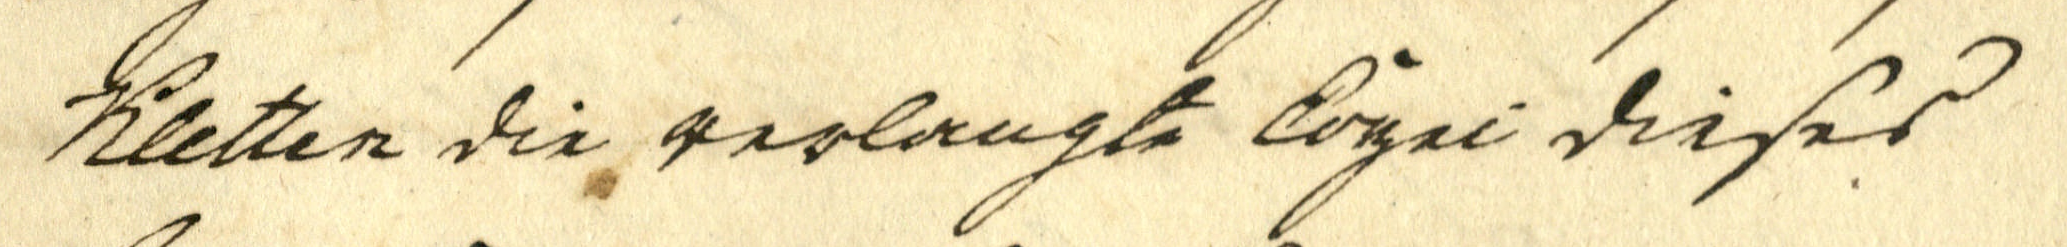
Kletten die verlangte Copei dieses
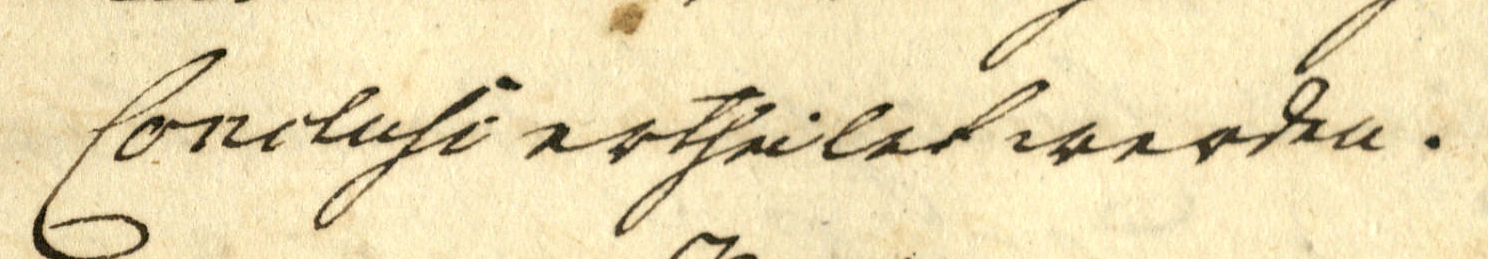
Conclusi ertheilet werden.
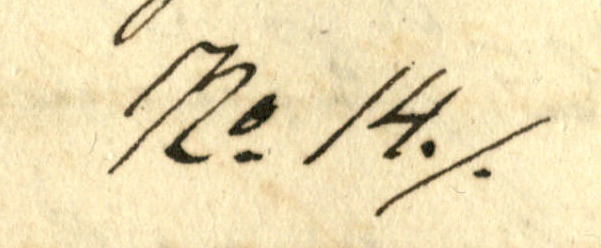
No. 14./.
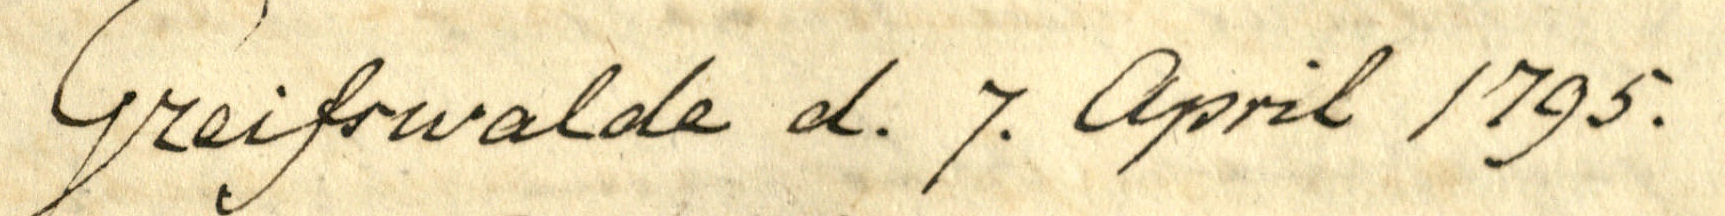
Greifswalde d. 7. April 1795
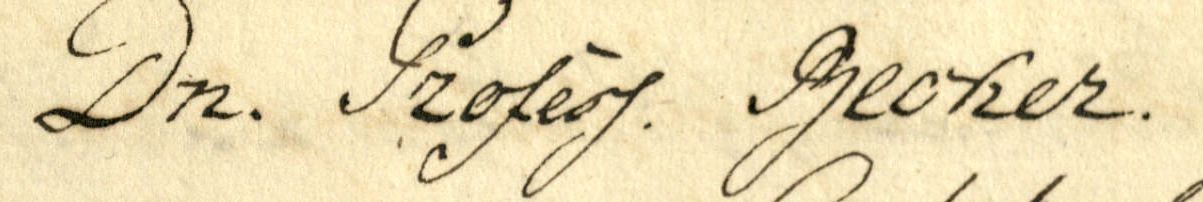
Dn. Profess. Becker.
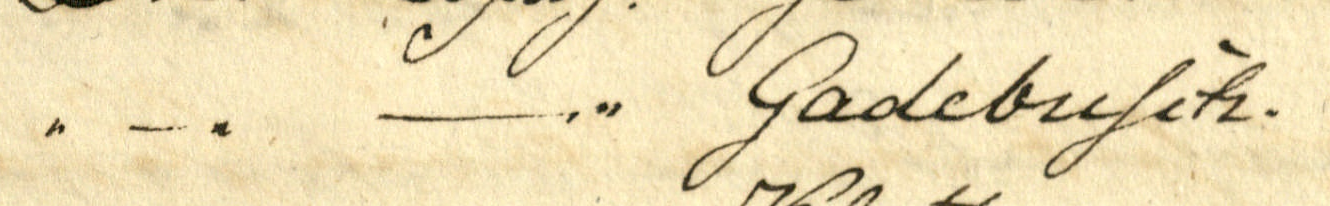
Gadebusch.
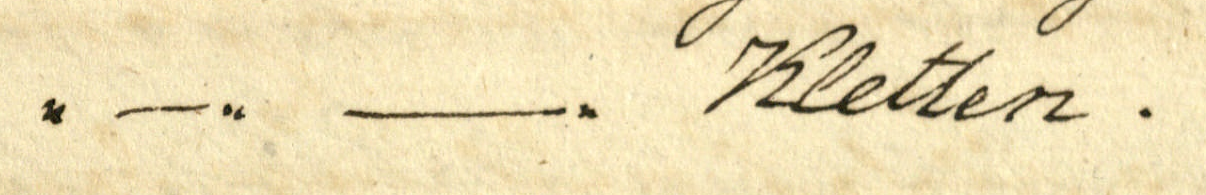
Kletten.
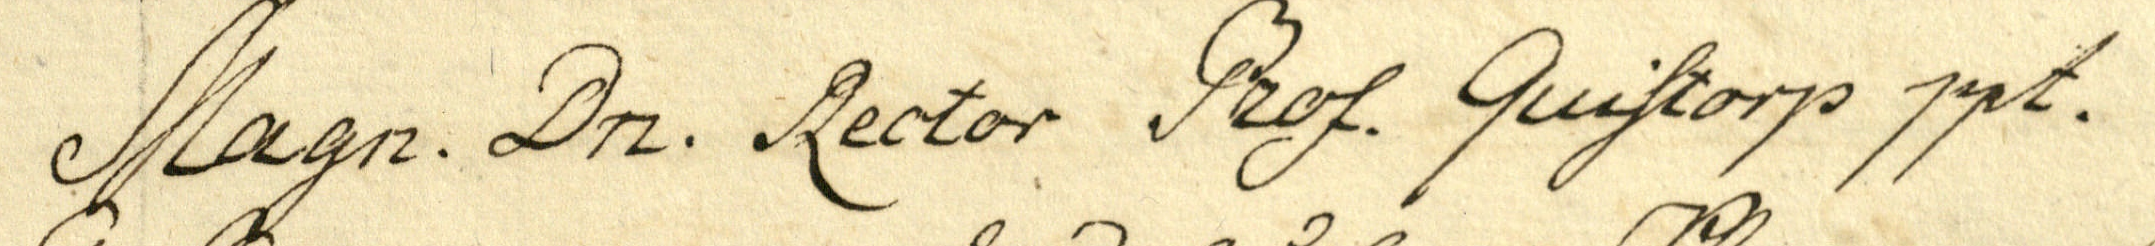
Magn. Dn. Rector Prof. Quistorp ppt.
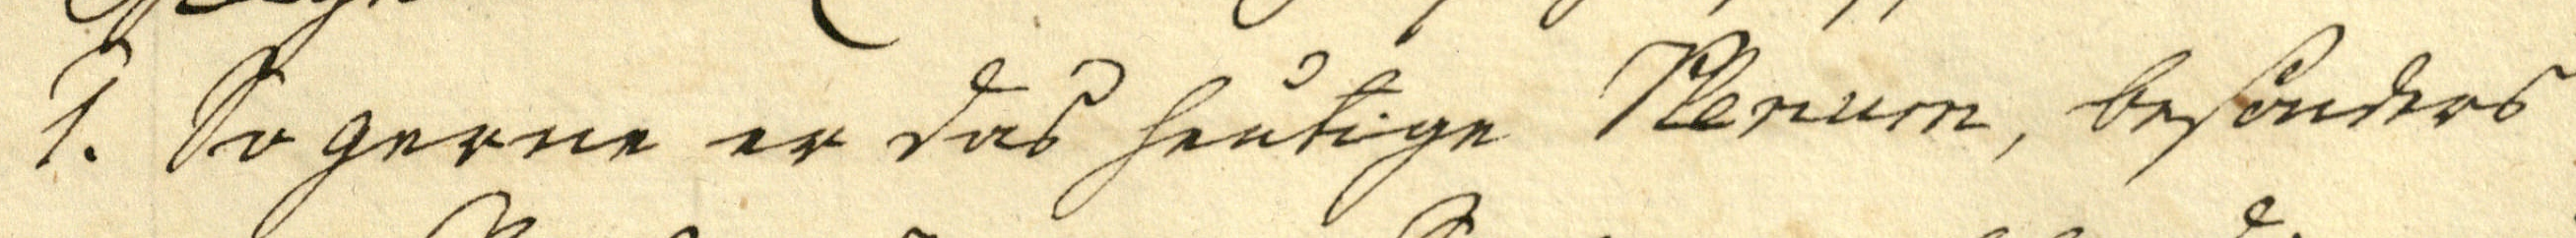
1. So gerne er das heutige Plenum, besonders
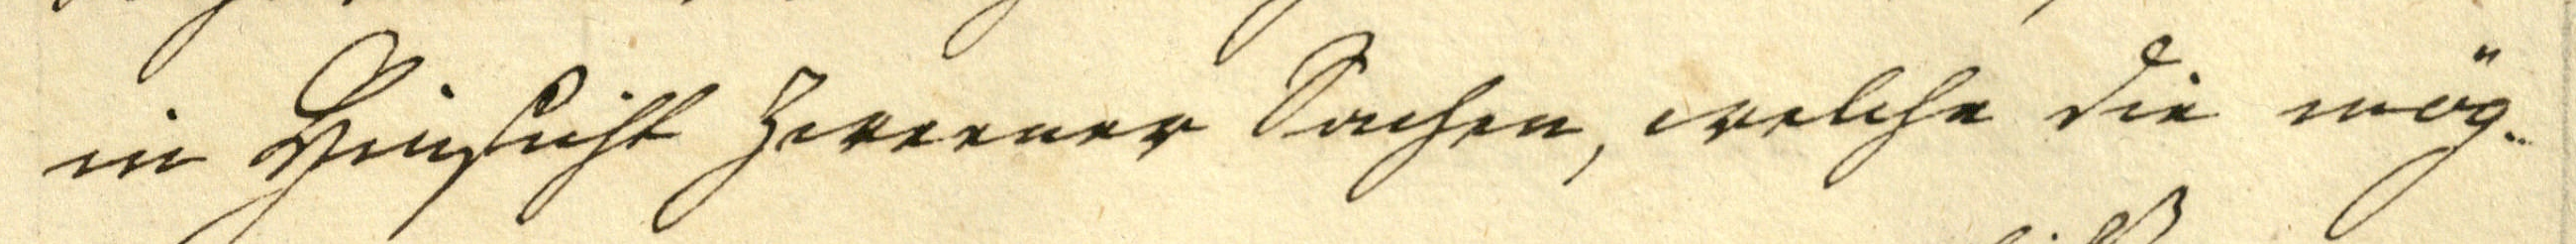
in Hinsicht zweener Sachen, welche die mög¬
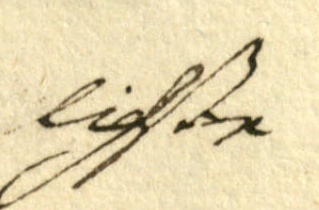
lichste
